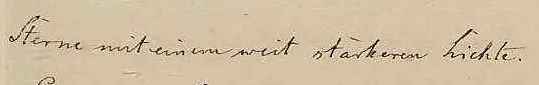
Sterne mit einem weit stärkeren Lichte.
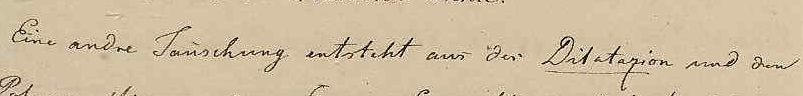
Eine andre Täuschung entsteht aus der Dilatazion und den
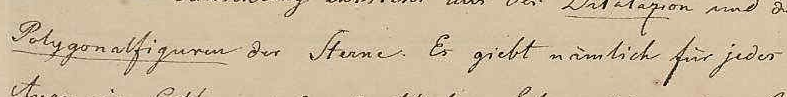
Polygonalfiguren der Sterne. Es giebt nämlich für jedes
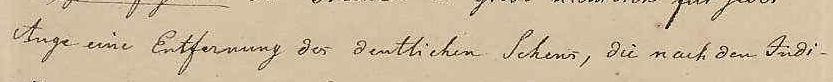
Auge eine Entfernung des deutlichen Sehens, die nach den Indi-
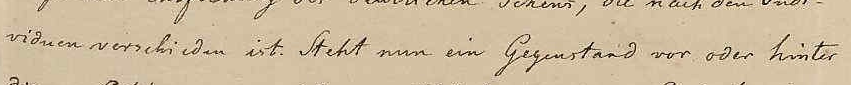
viduen verschieden ist. Steht nun ein Gegenstand vor oder hinter
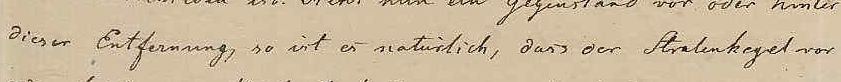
dieser Entfernung, so ist es natürlich, dass der Stralenkegel vor
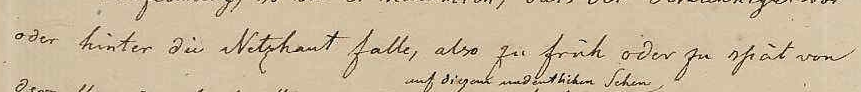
oder hinter die Netzhaut falle, also zu früh oder zu spät von
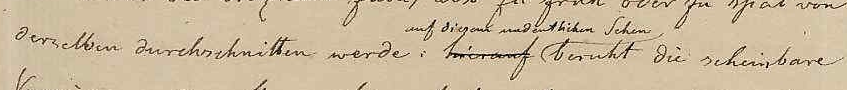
derselben durchschnitten werde: hieraufauf diesem undeutlichen Sehen beruht
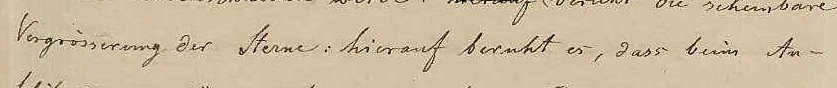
Vergrösserung der Sterne: hierauf beruht es, dass beim An-
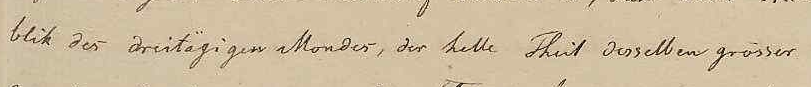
blik des dreitägigen Mondes, der helle Theil desselben grösser
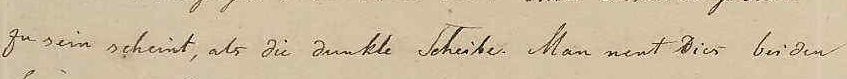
zu sein scheint, als die dunkle Scheibe. Man nent bdies beiden
